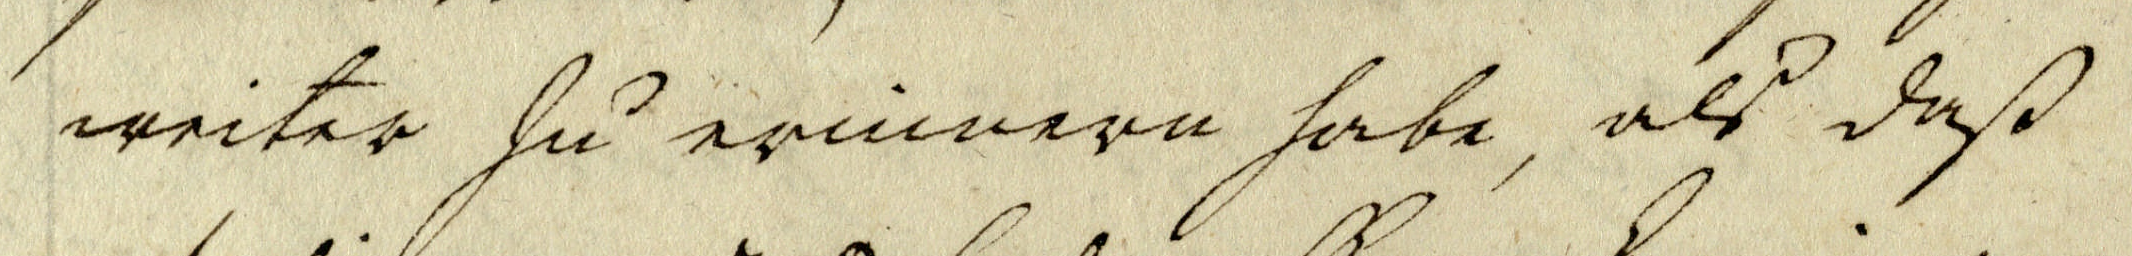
weiter zu erinnern habe, als daß
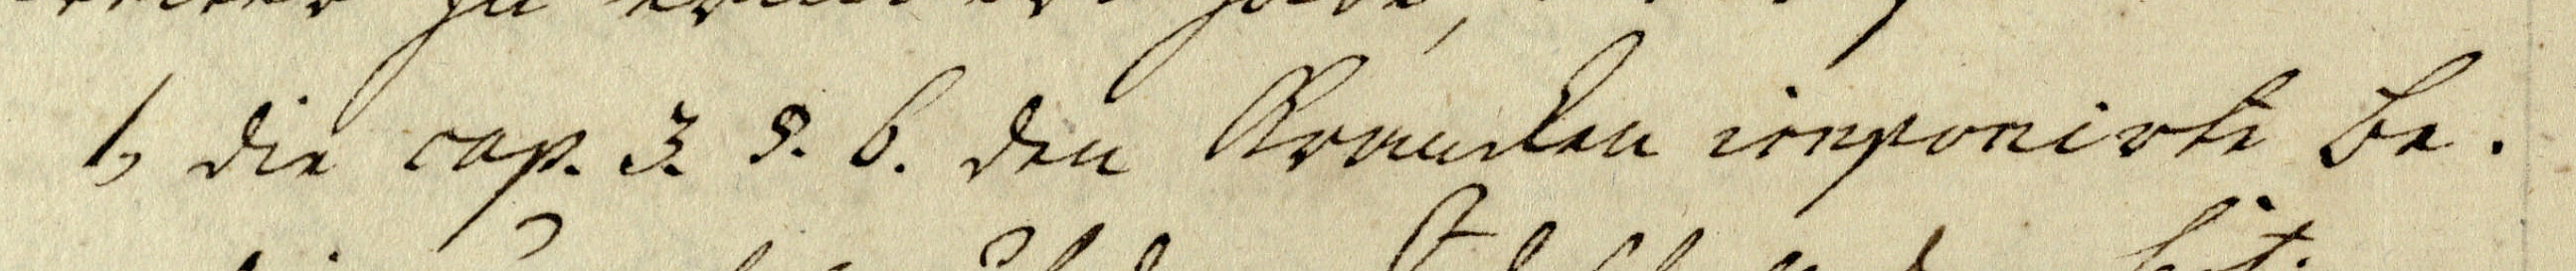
1., die cap. 3. § 6. den Krancken imponirte Be¬
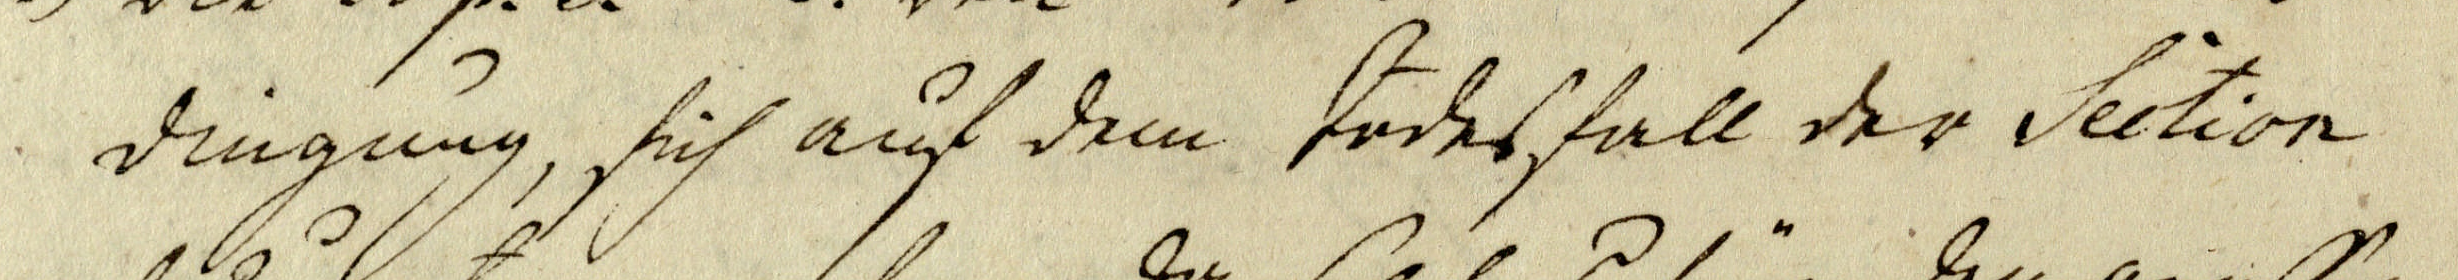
dingung, sich auf dem Todesfall der Section
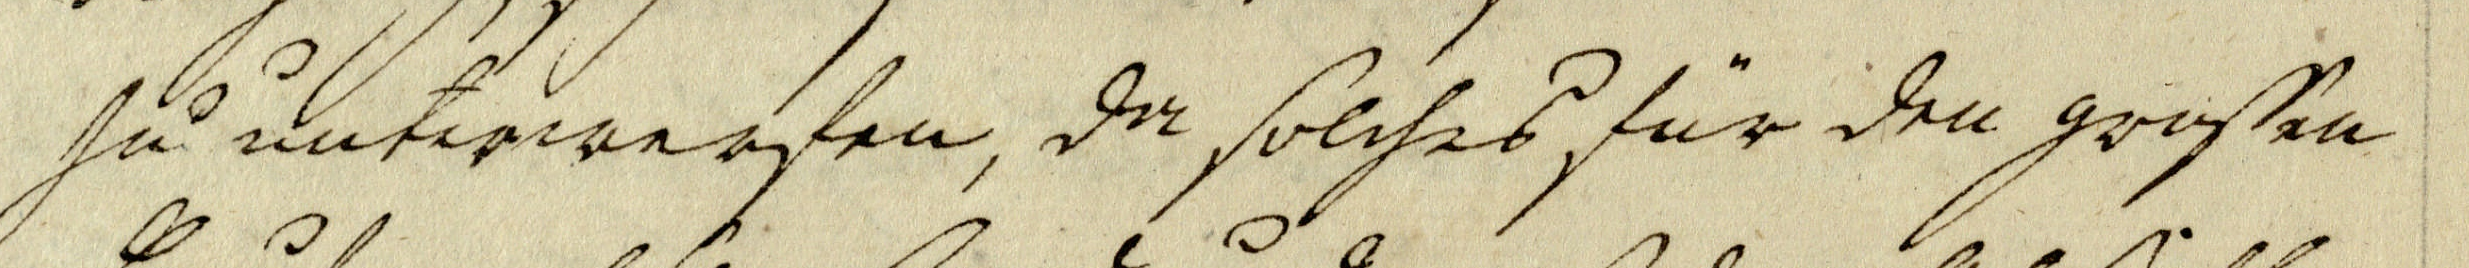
zu unterwerfen, da solches für den grossen
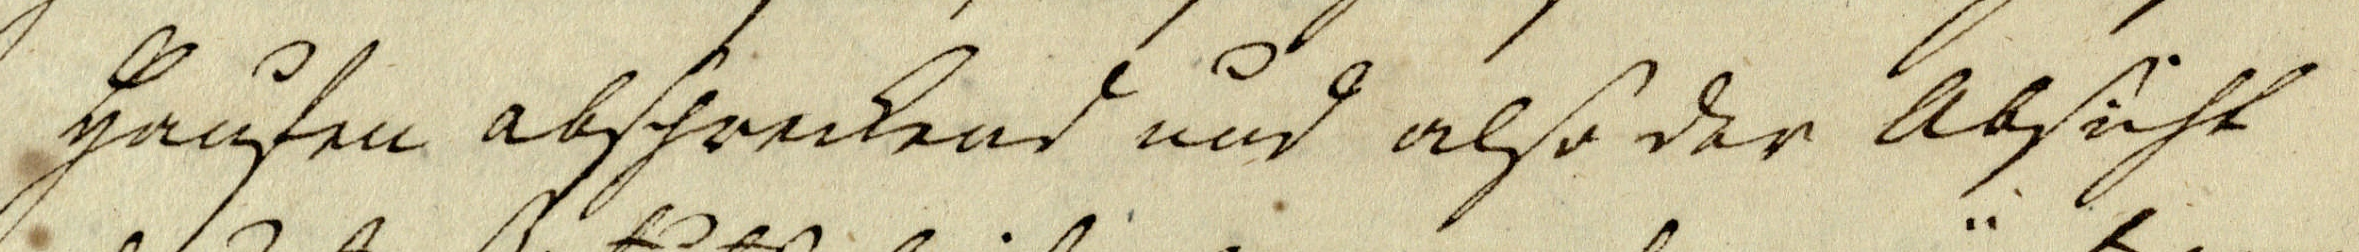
Haufen abschreckend und also der Absicht
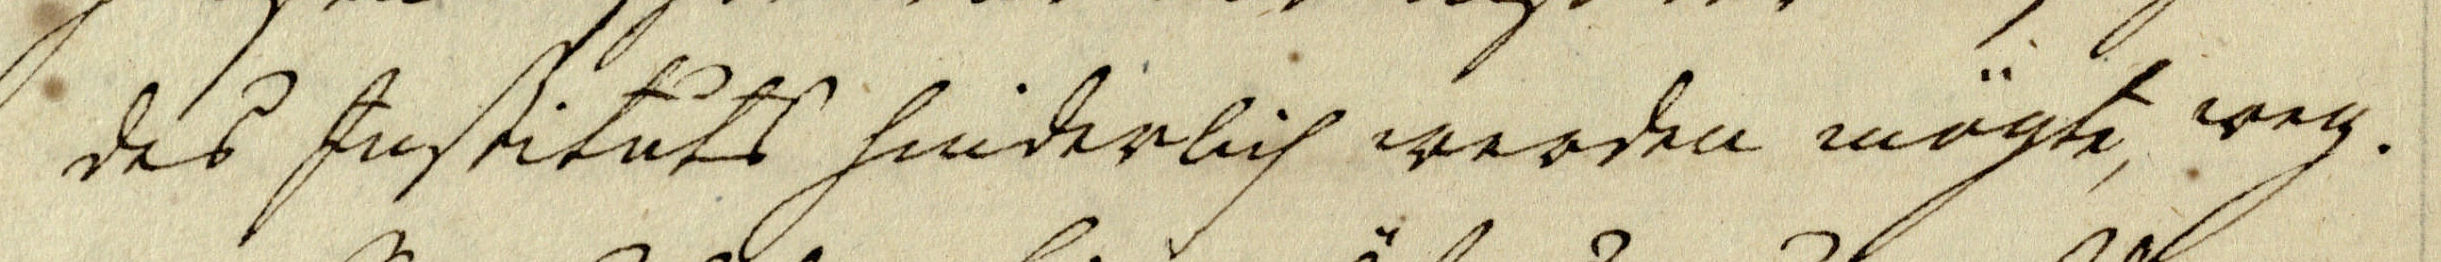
des Instituts hinderlich werden mögte, weg¬
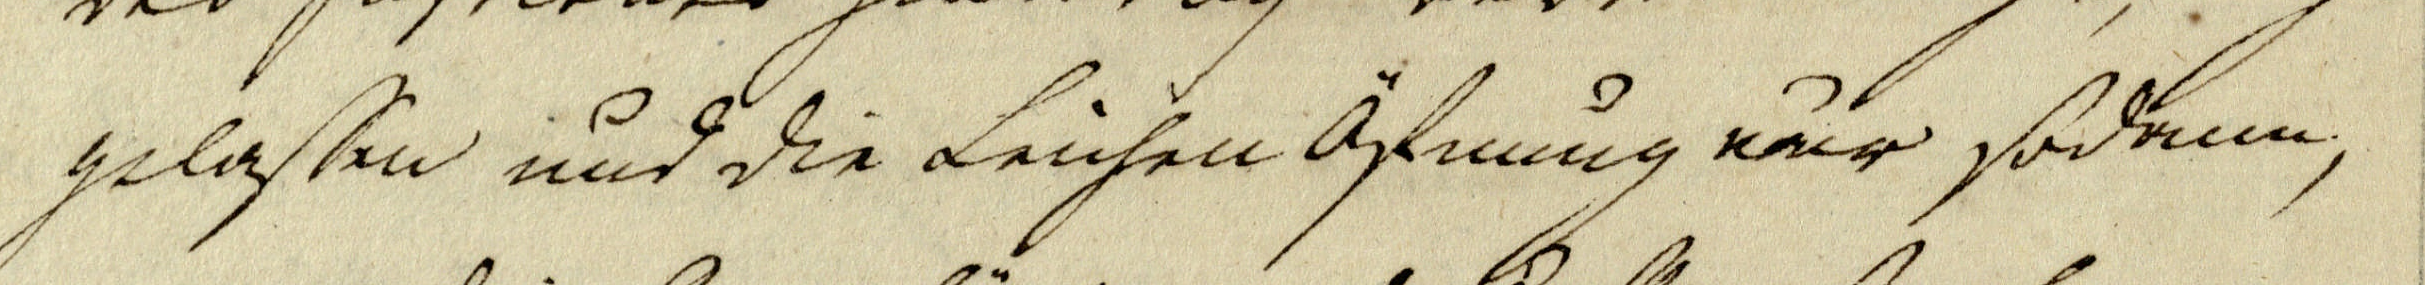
gelassen und die Leichen Öfnung nur sodann,
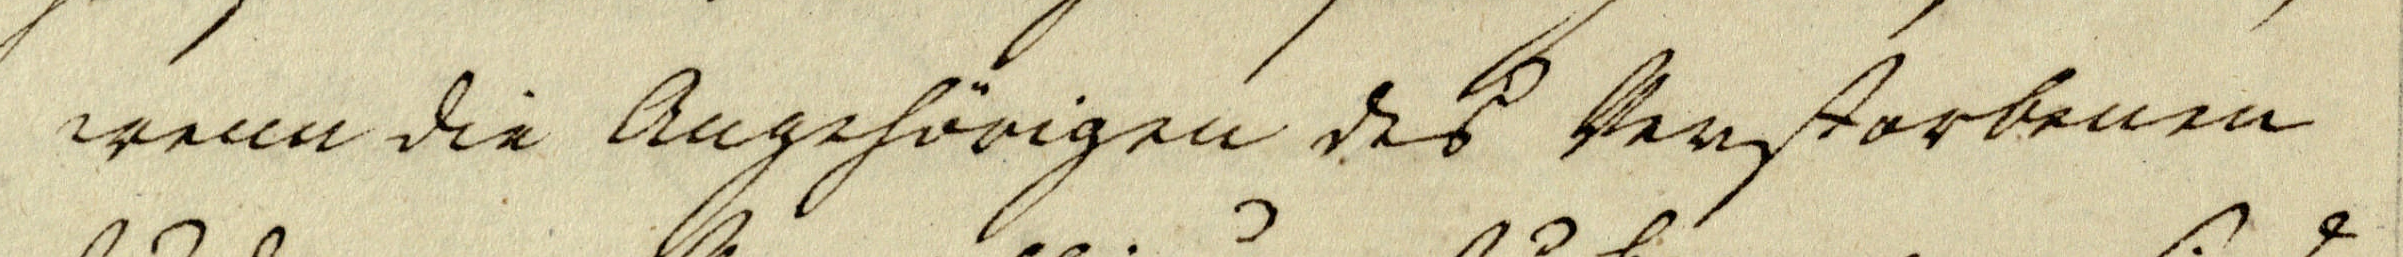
wenn die Angehörigen des Verstorbenen
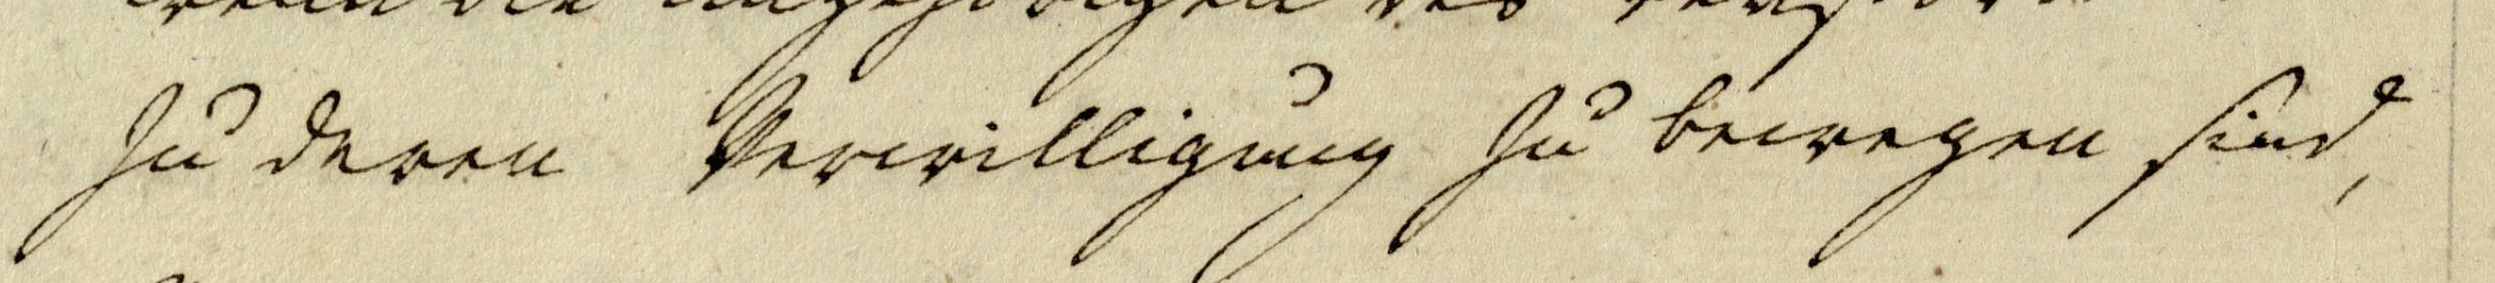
zu deren Verwilligung zu bewegen sind,
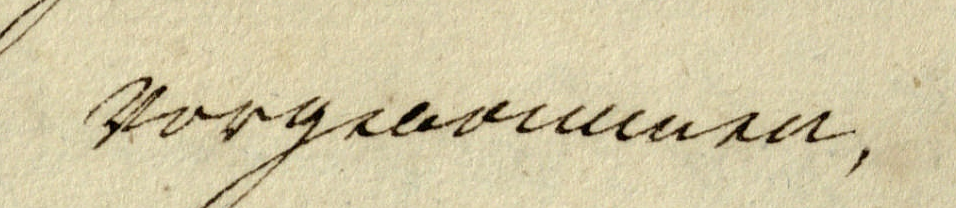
vorgenommen,
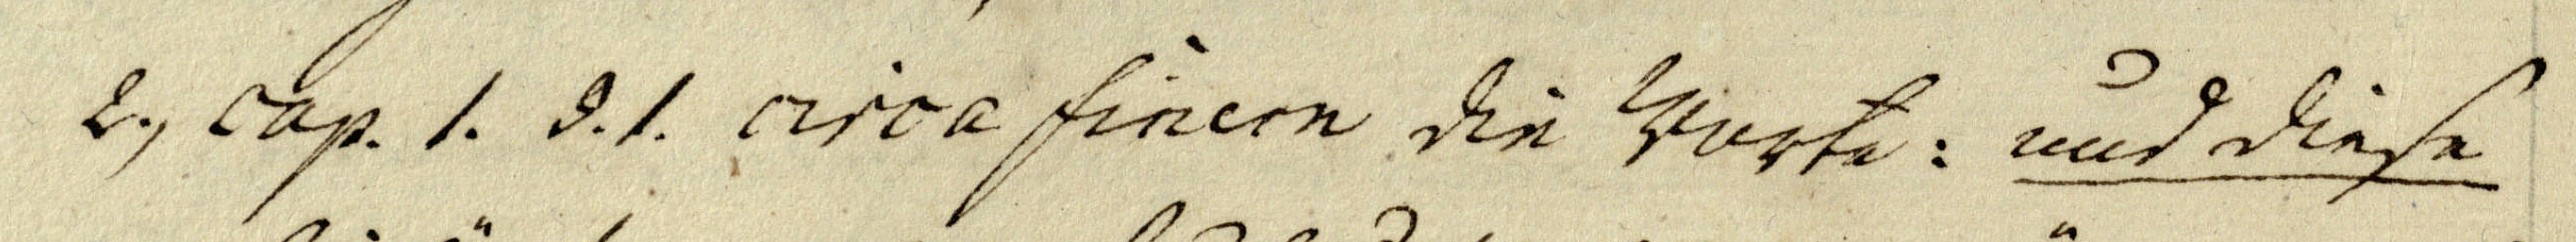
2, cap. 1. §. 1. circa finem die Worte: und diese
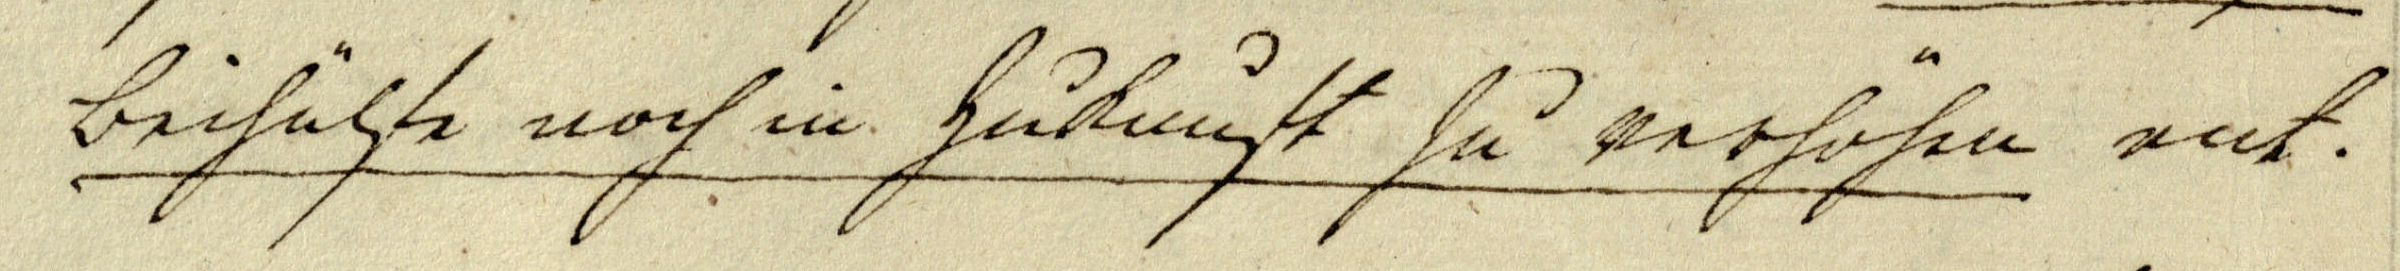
Beihülfe noch in Zukunft zu verhöhen ent¬
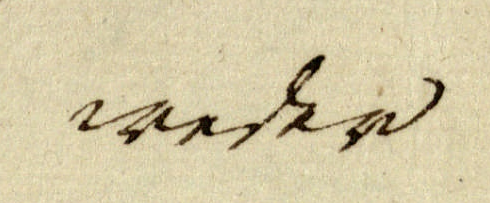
weder
